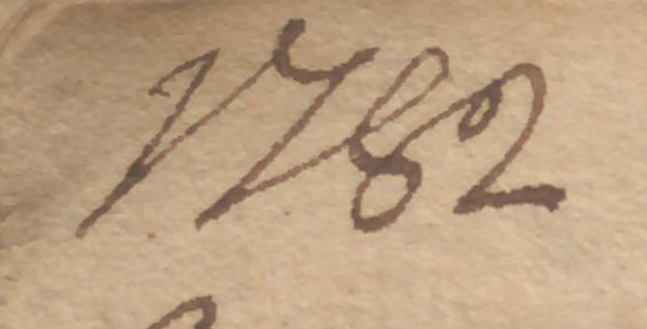1782
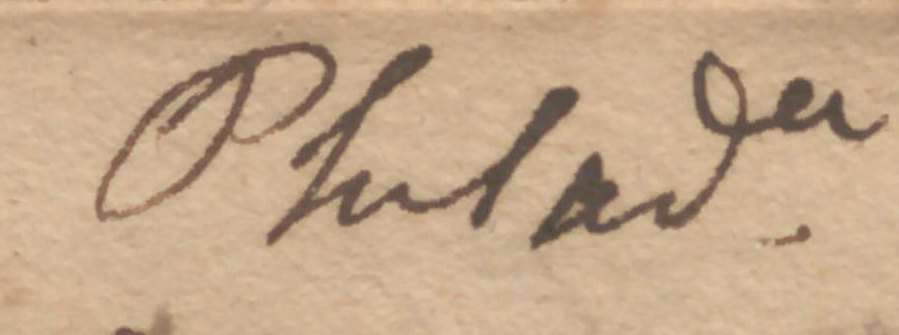Philad^a.
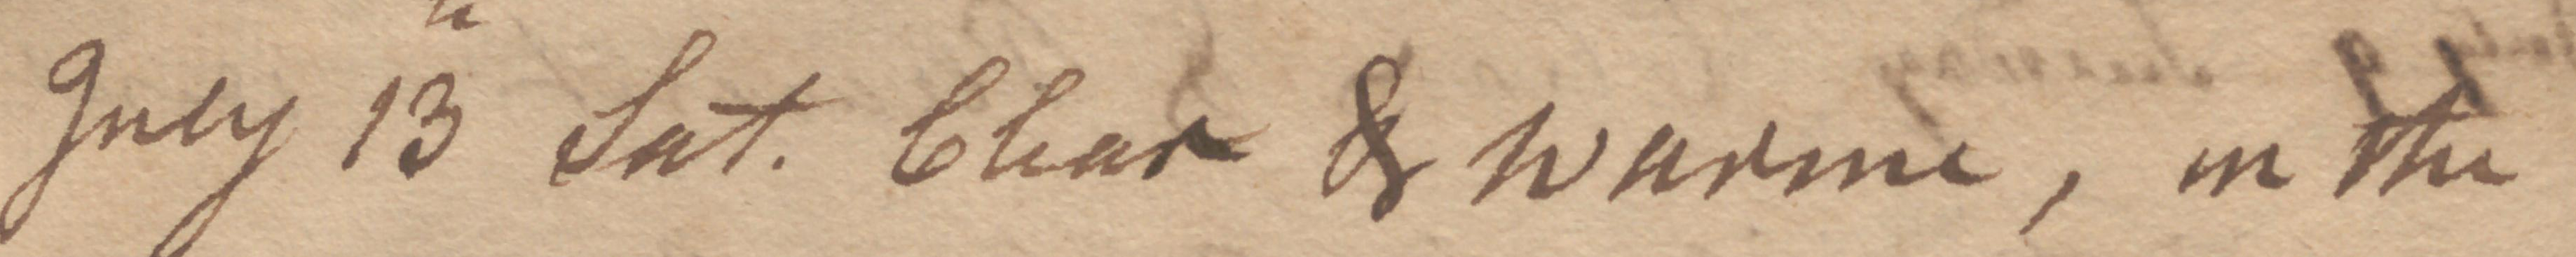July 13^h Sat. Clear & warme, in the
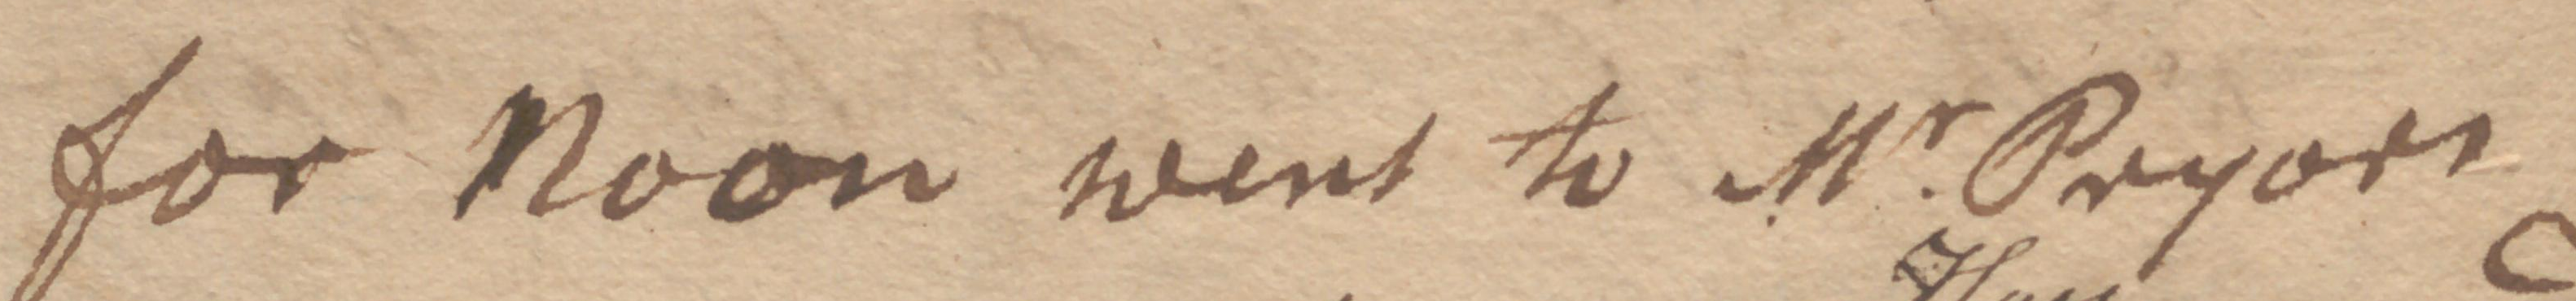for noon went to M^r. Pryors
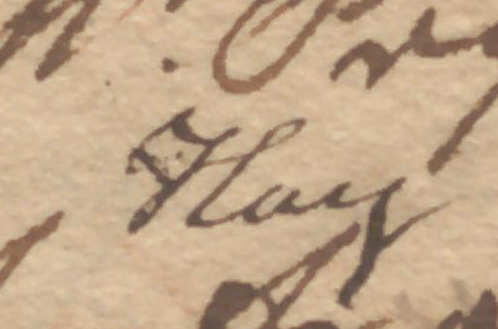Hay
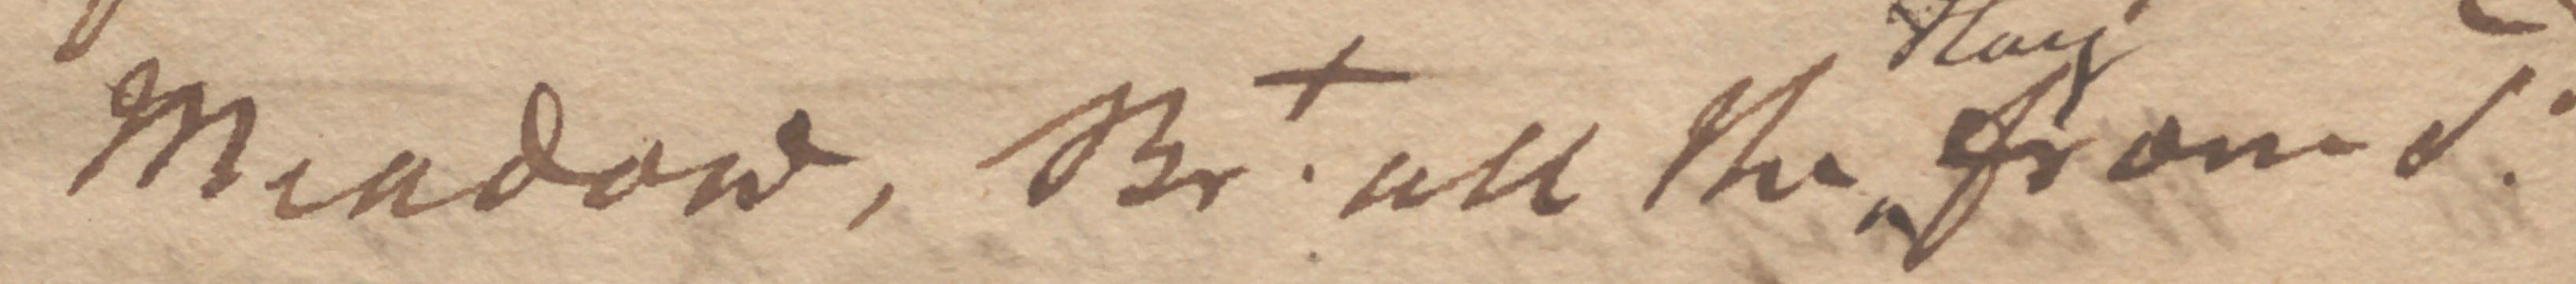Meadow, Br^t. all the ^ from s^d.
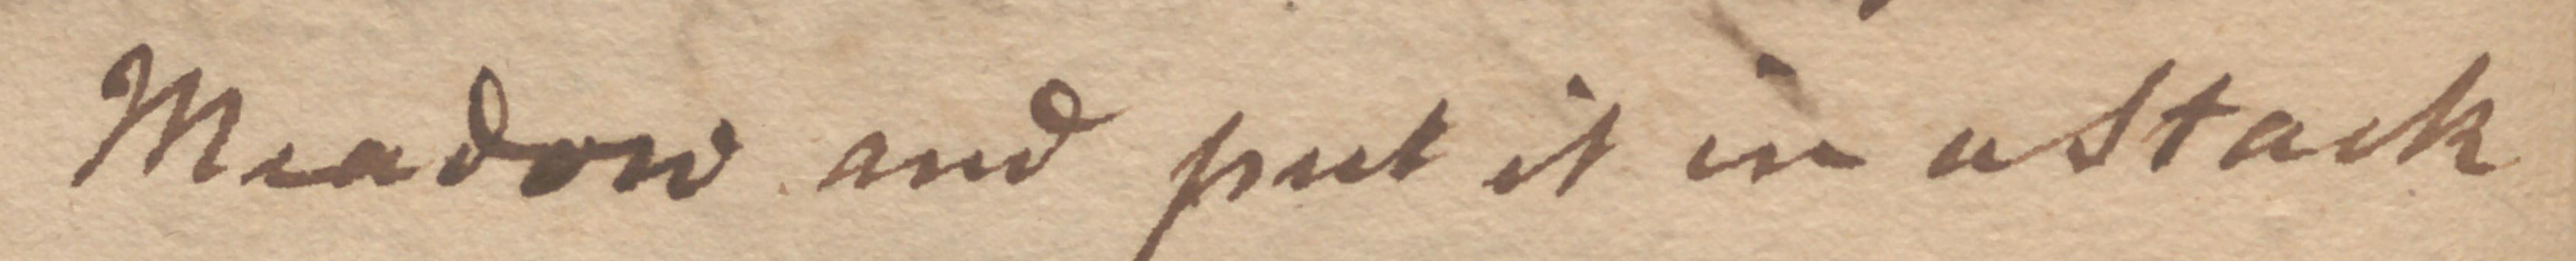Meadow, and put it in a Stack
